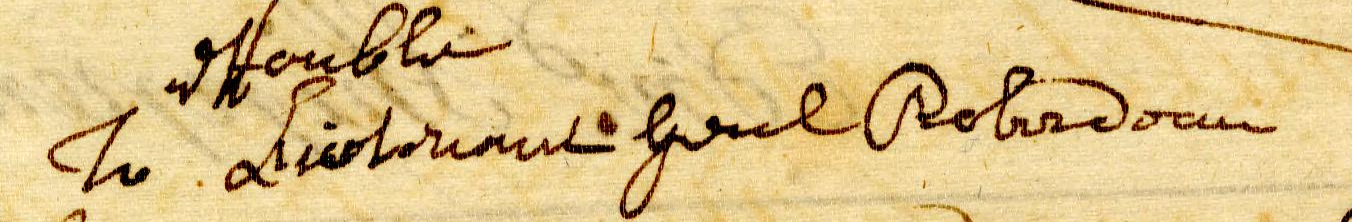To Lieutenant Genl Roberdeau
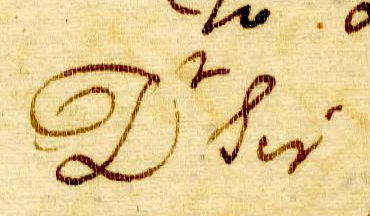D^r Sir
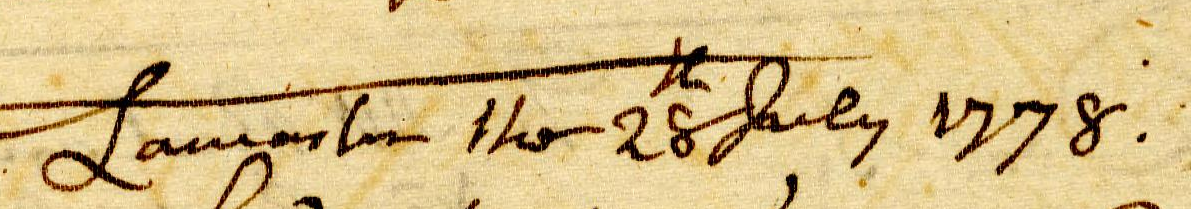Lancaster the 28^th July 1778.
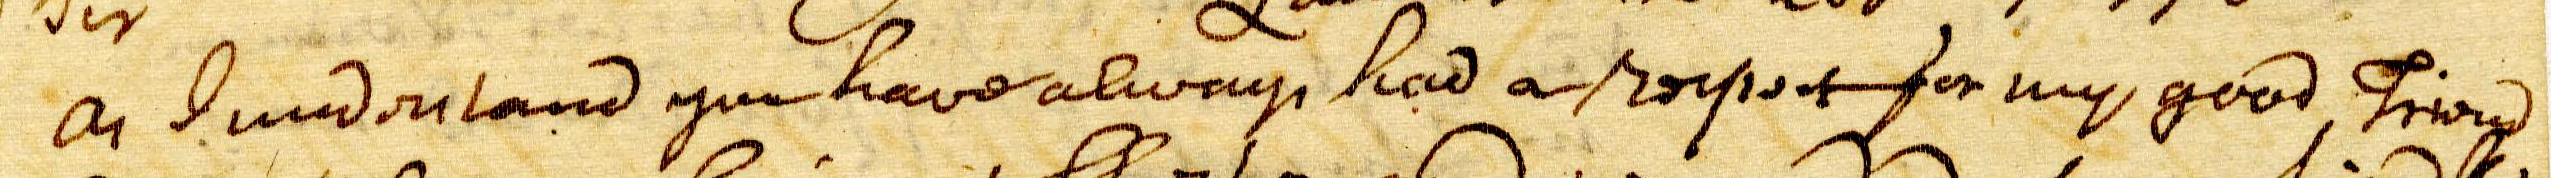As I understand you have always had a respect for my good Friend
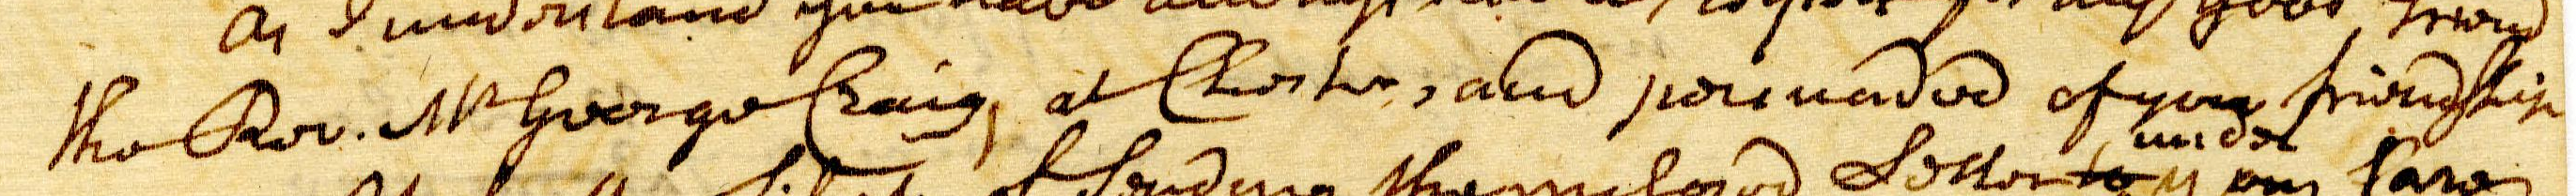the Rev. M^r George Craig at Chester, and persuaded of your friendship
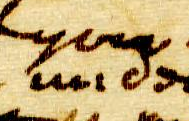under
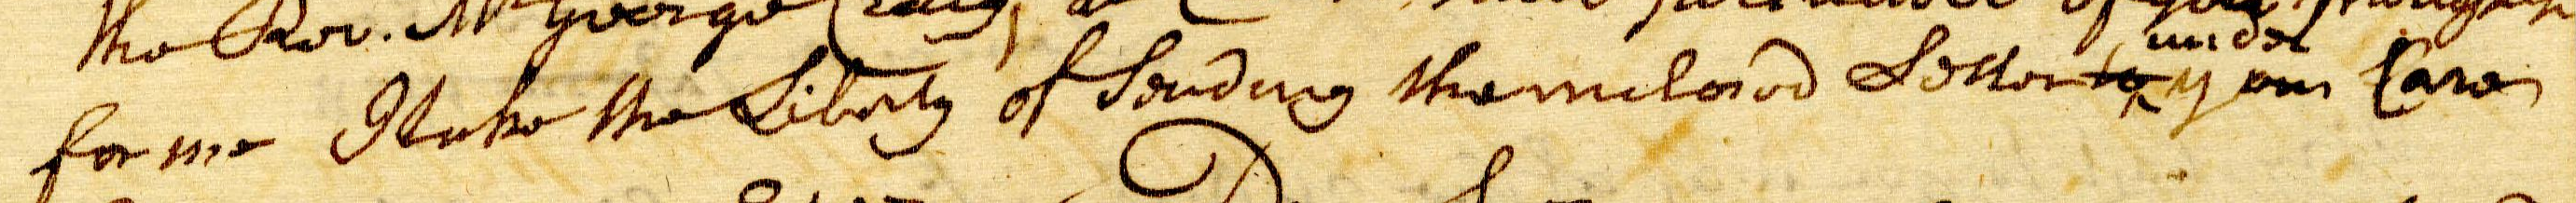for me I take the Liberty of Sending the inclosed Letter [to] ^ your Care
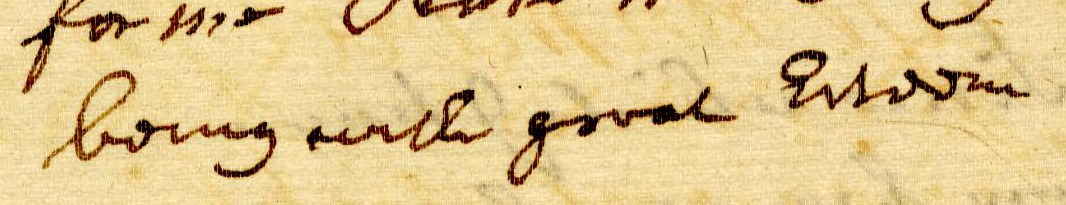being with great Esteem
